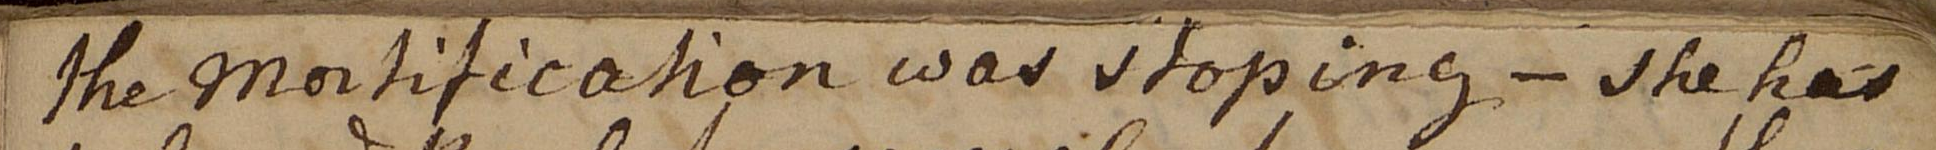the Mortification was stoping- she has
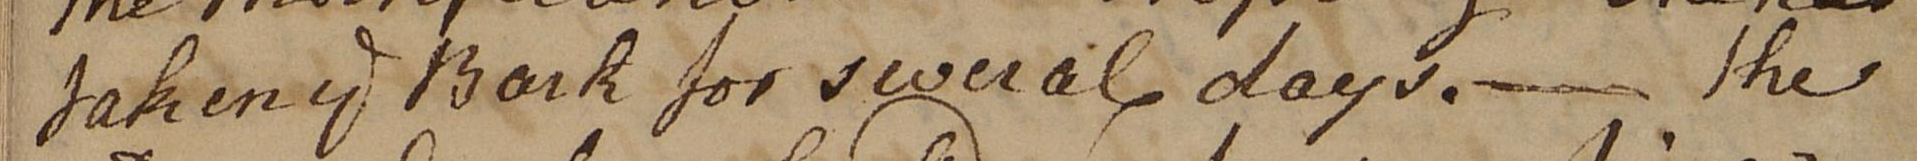taken y^e Bark for several days.- the
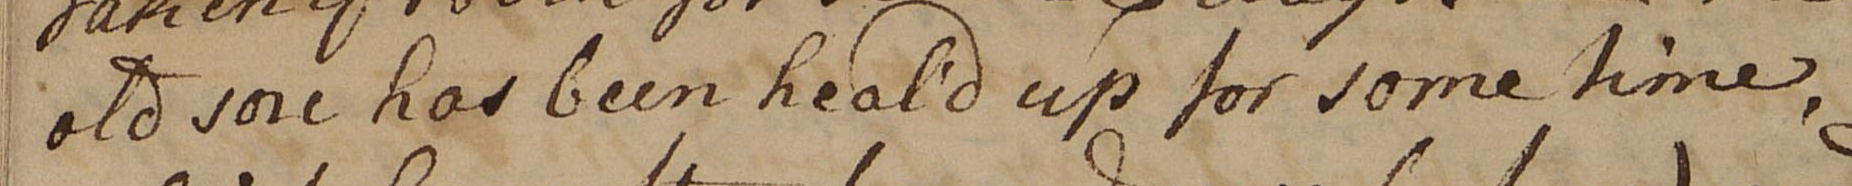old sore has been heal'd up for some time,
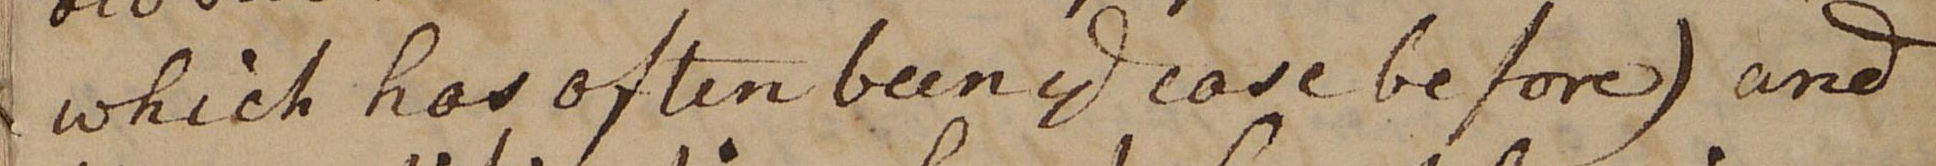which has often been y^e case be fore) and
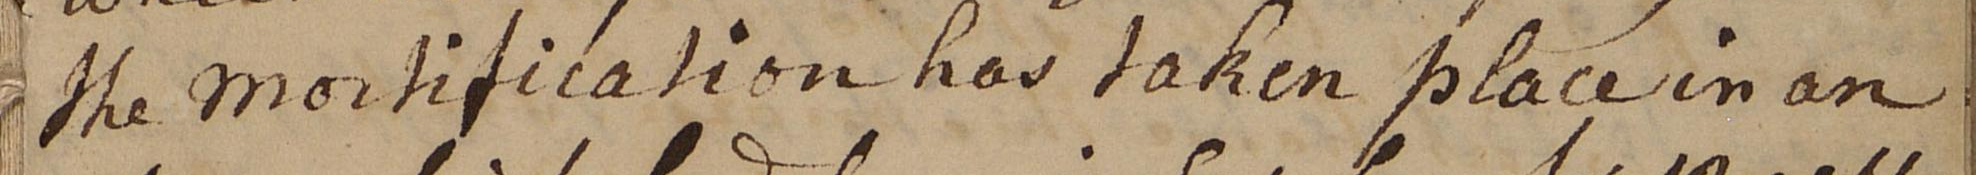the mortification has taken place in an
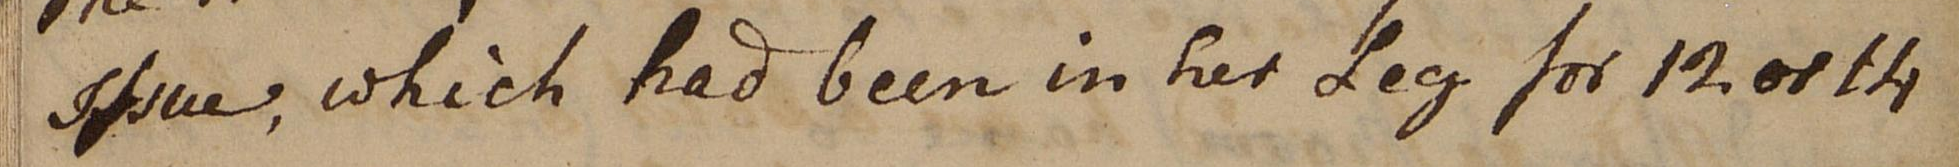Issue, which had been in her Leg for 12 or 14
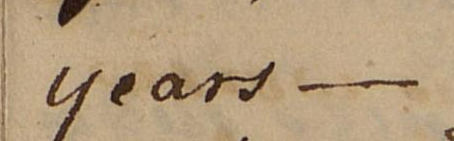years-
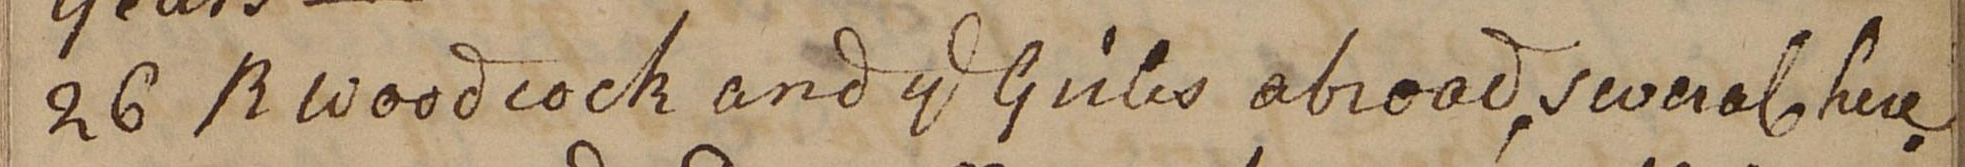26 R Woodcock and y^e Girles abroad, several here
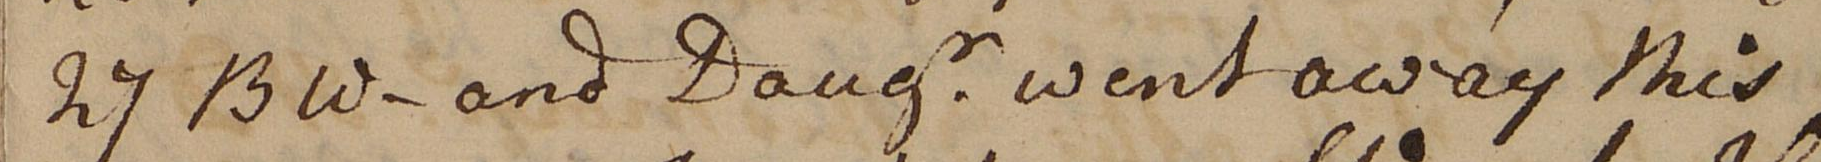27 BW- and Daug^r. went away this
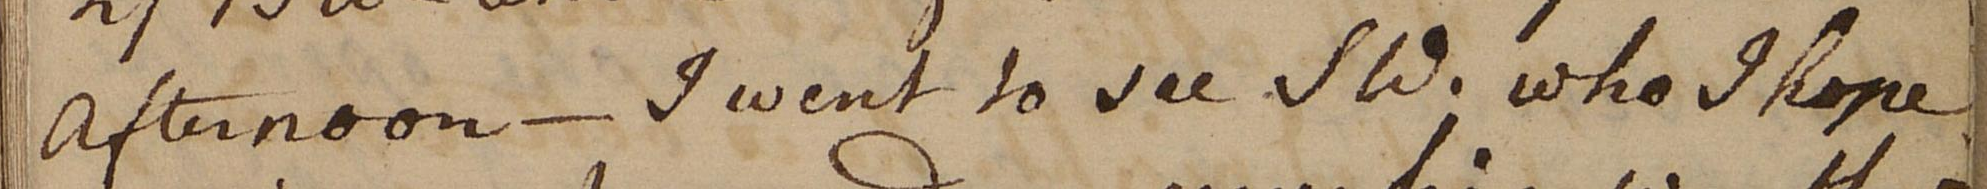Afternoon- I went to see SW. who I hope
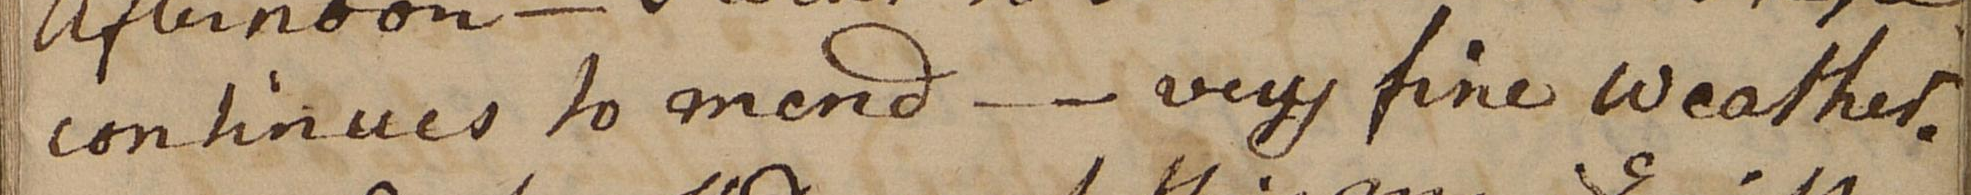continues to mend- very fine weather.
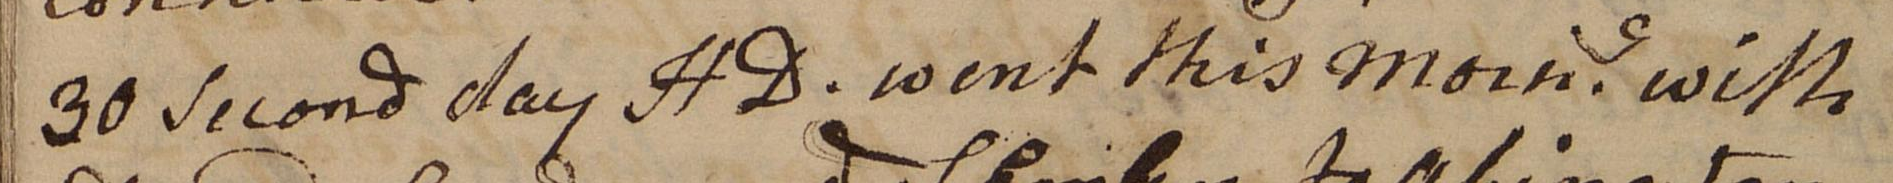30 second day HD. went this morn^g with
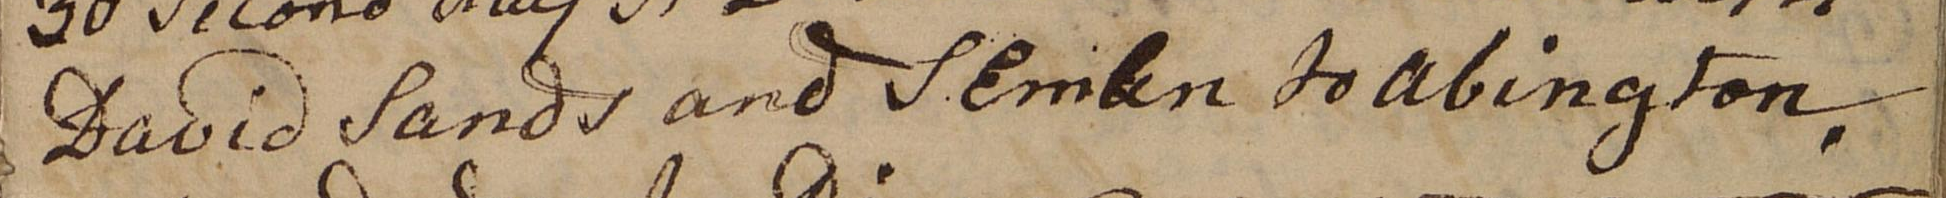David Sands and S Emlen to Abington,
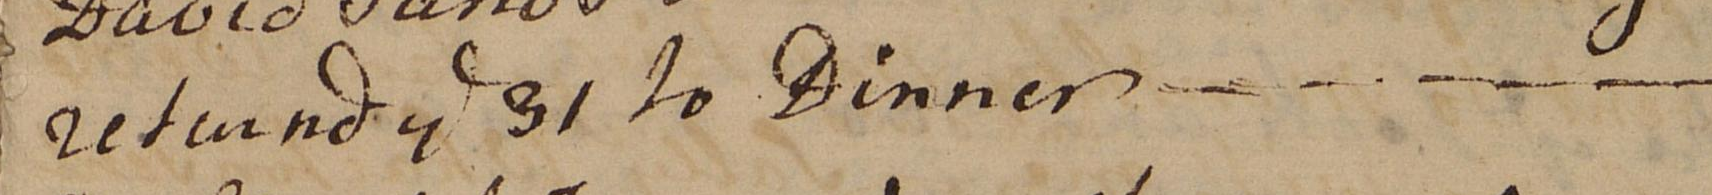returnd y^e 31 to Dinner-----
